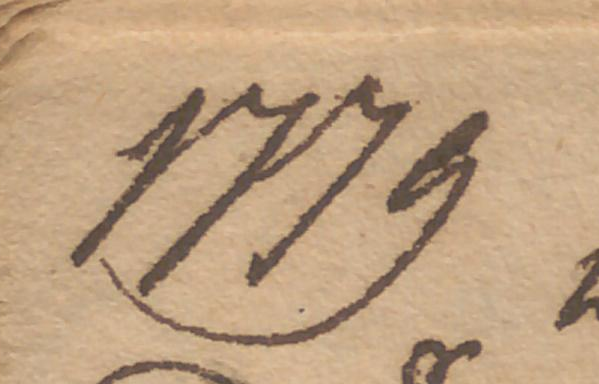1779
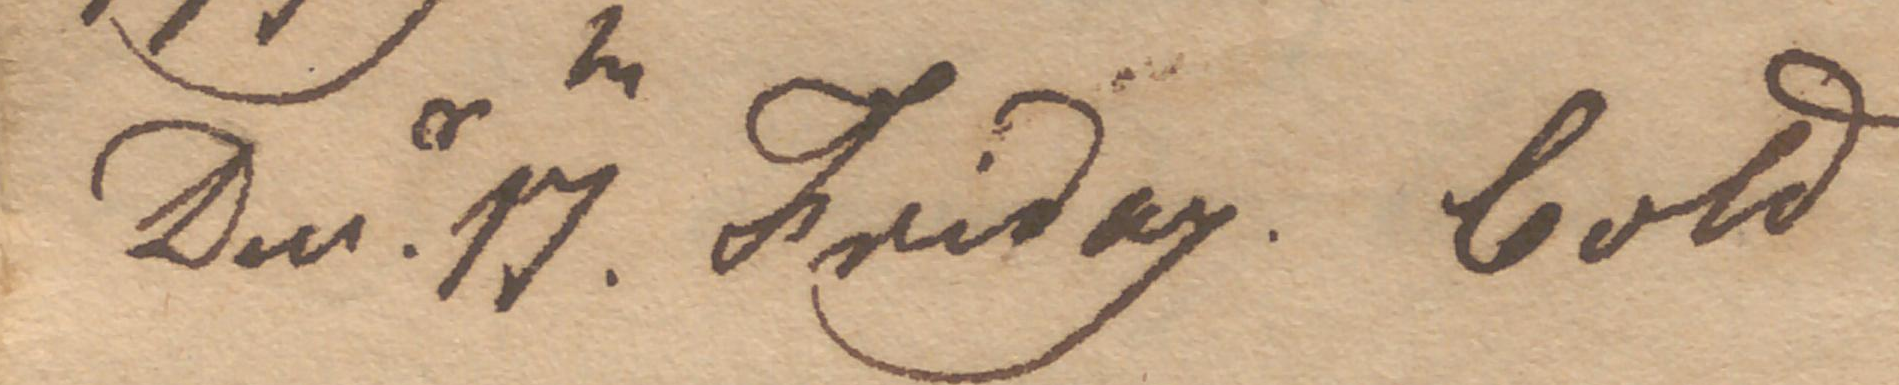Dec^r. 17^th. Friday. Cold
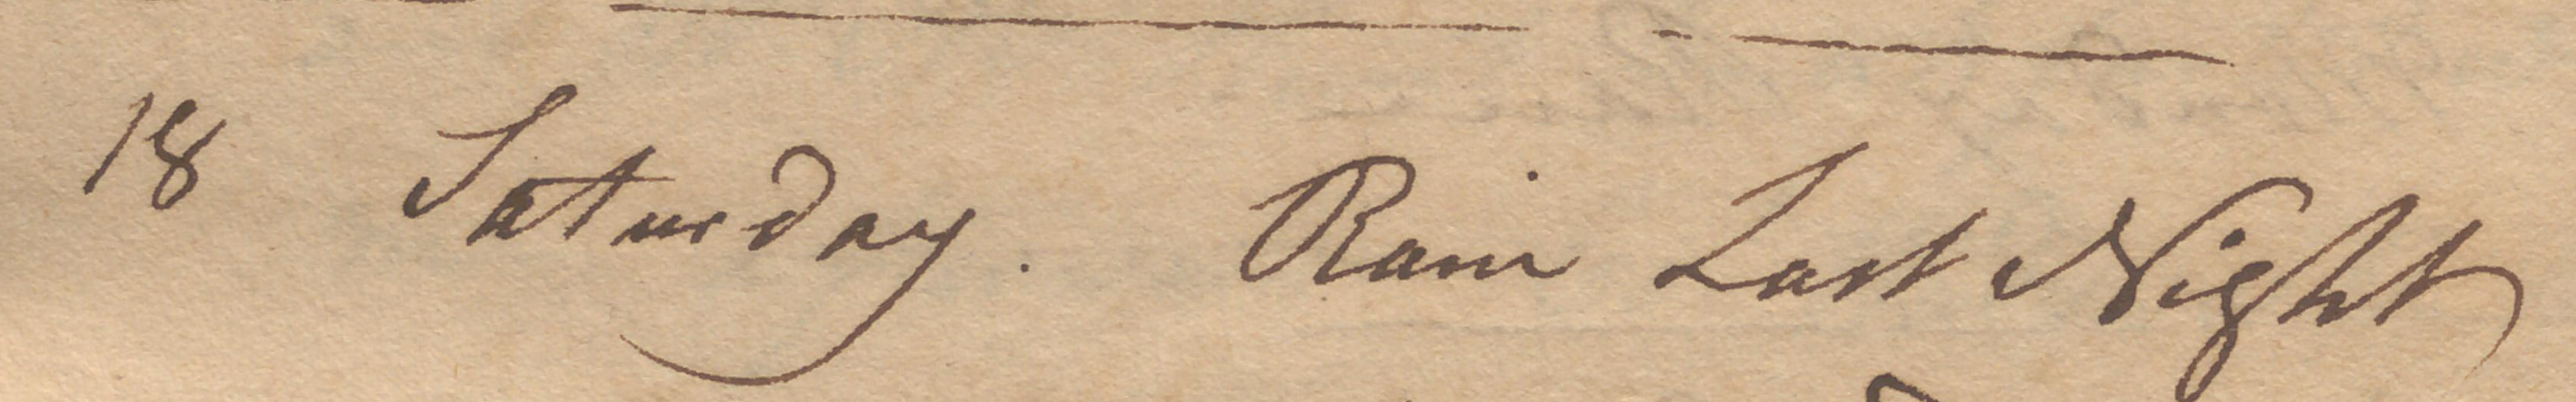18 Saturday. Rain Last Night
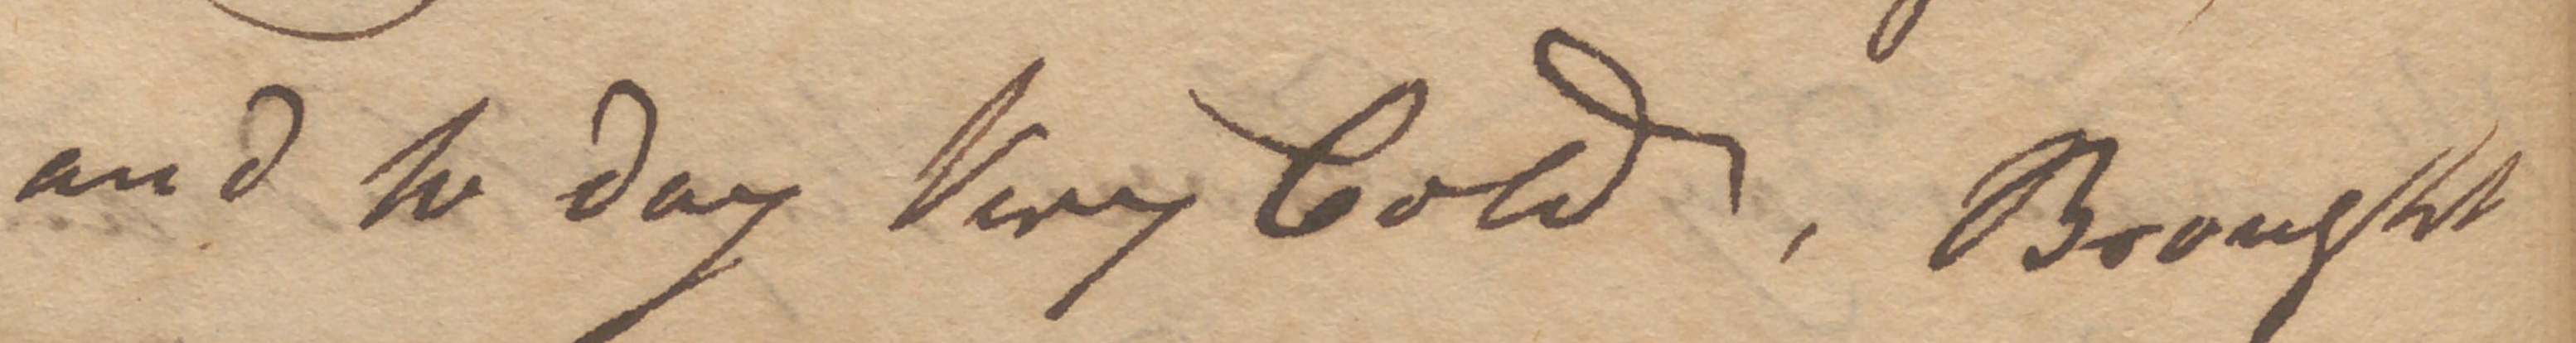and to day Very Cold. Brought
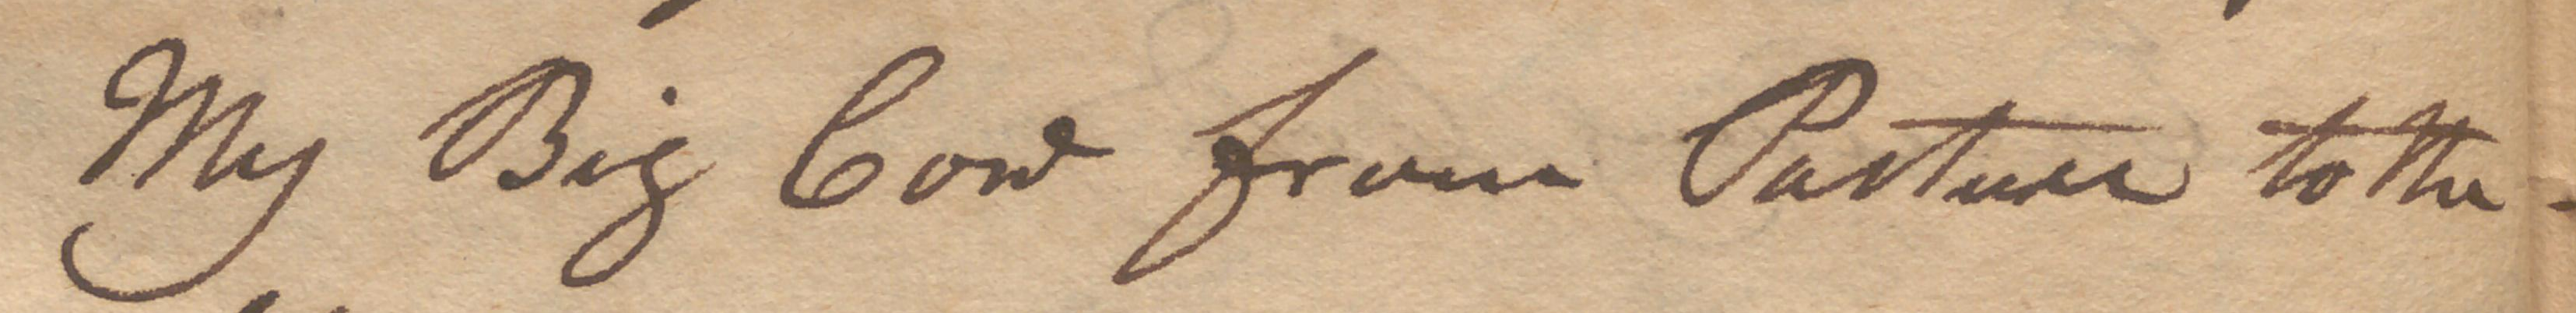My Big Cow from Pasture to the
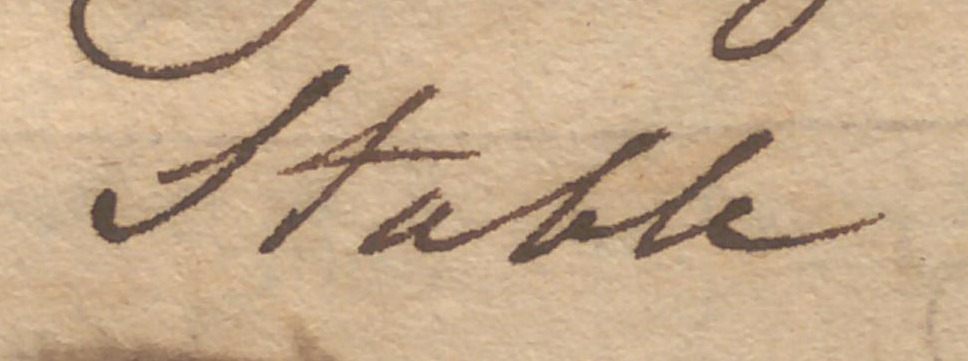Stable
